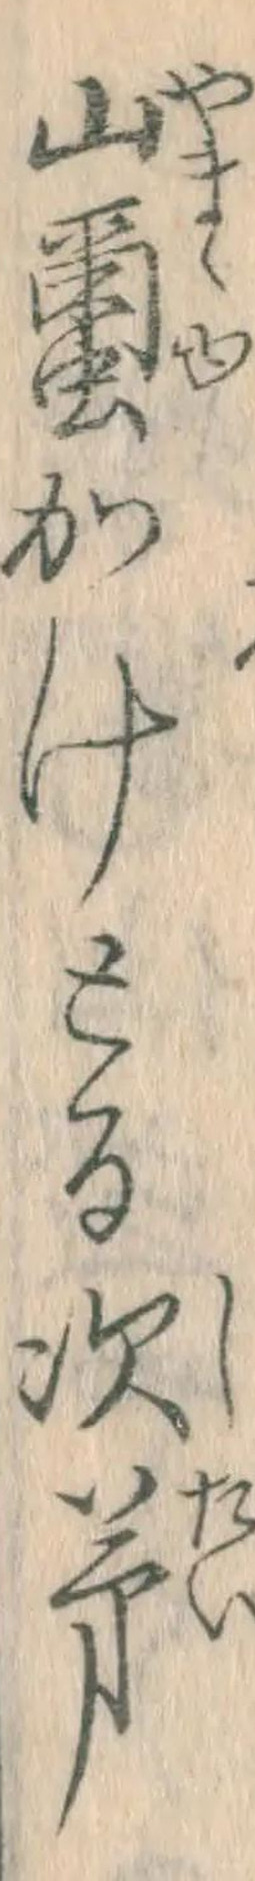山繭かけとる次第

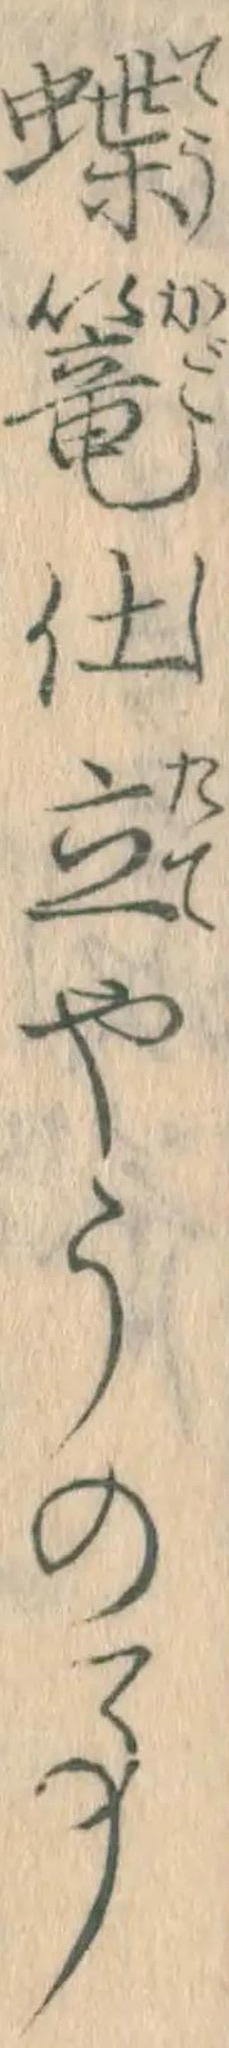蝶篭仕立やうの事
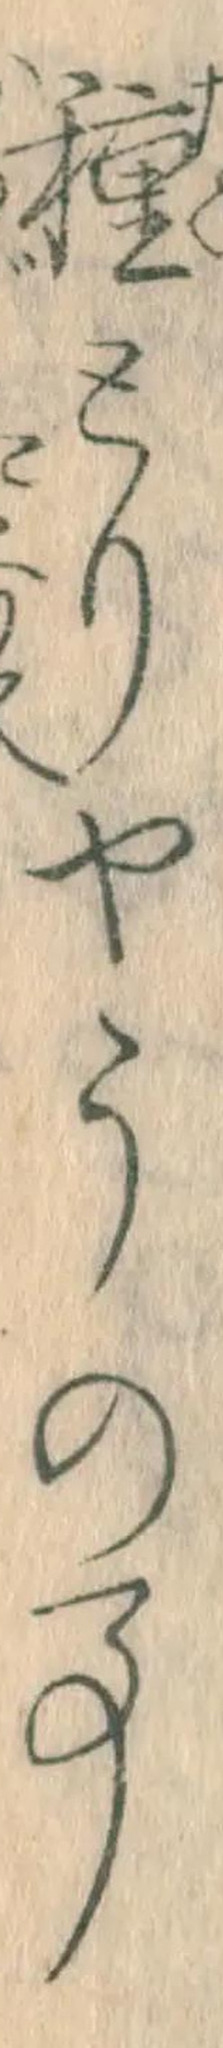種とりやうの事
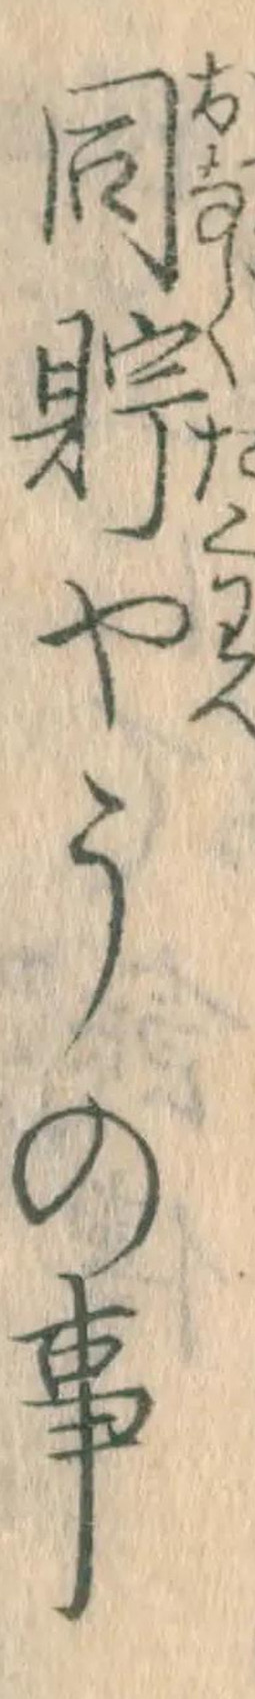同貯やうの事
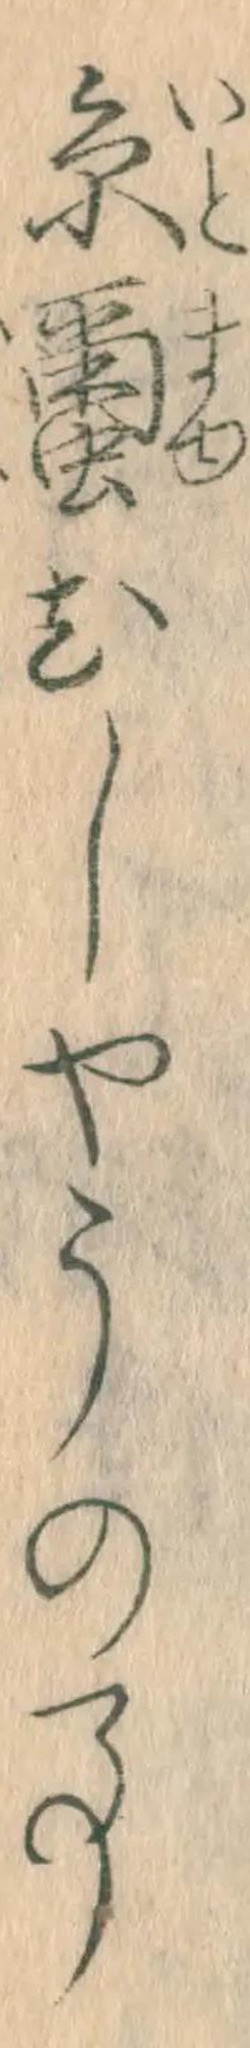糸繭むしやうの事
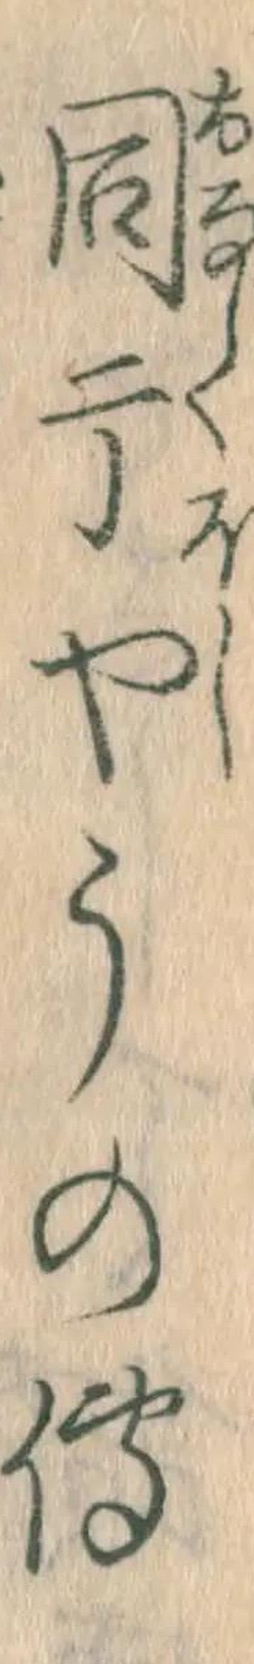同干やうの傳
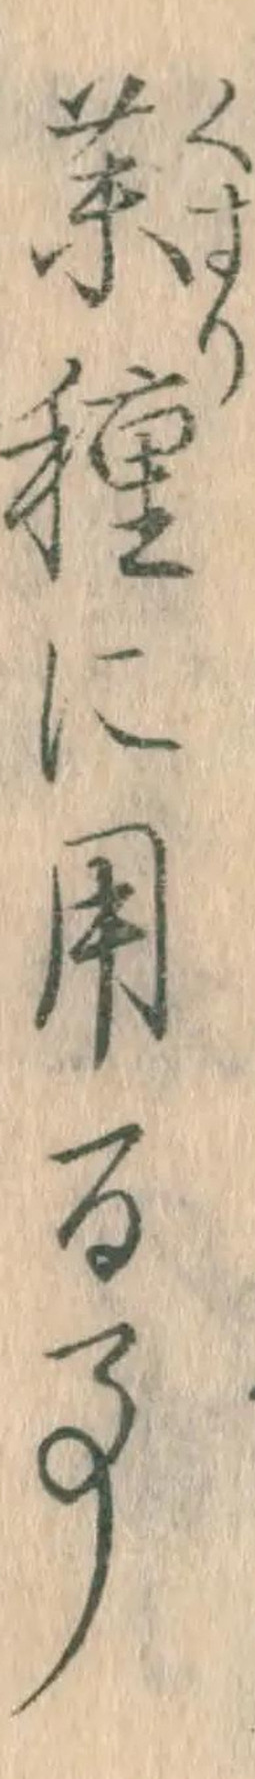薬種に用る事
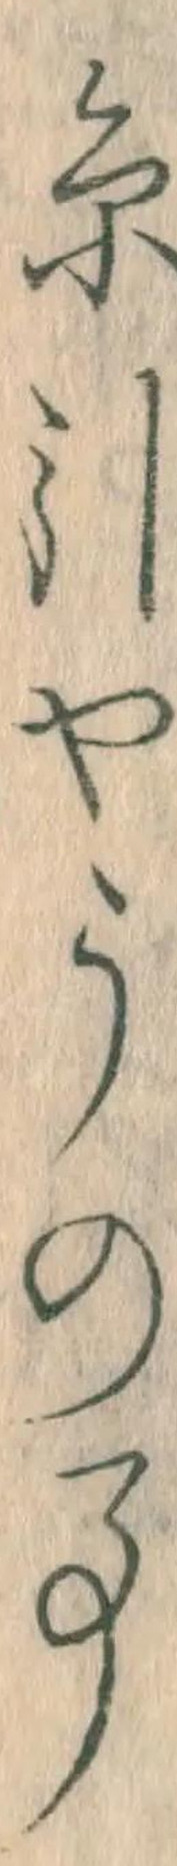糸引やうの事
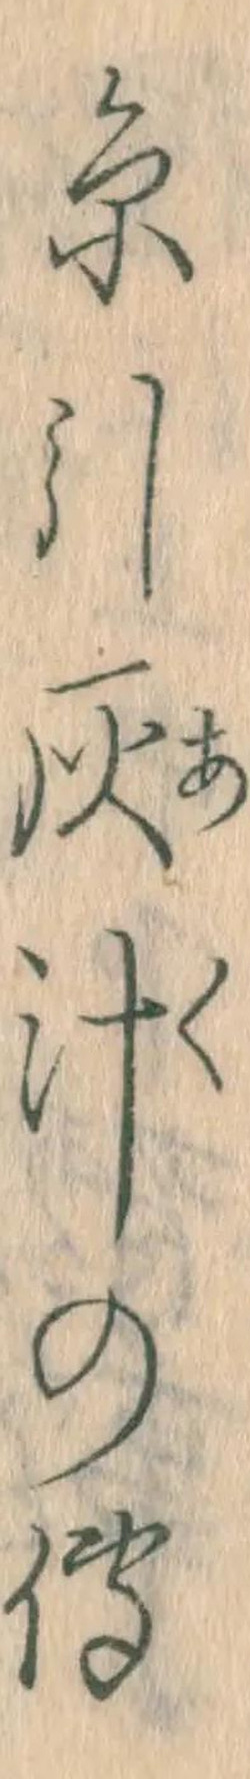糸引灰汁の傳
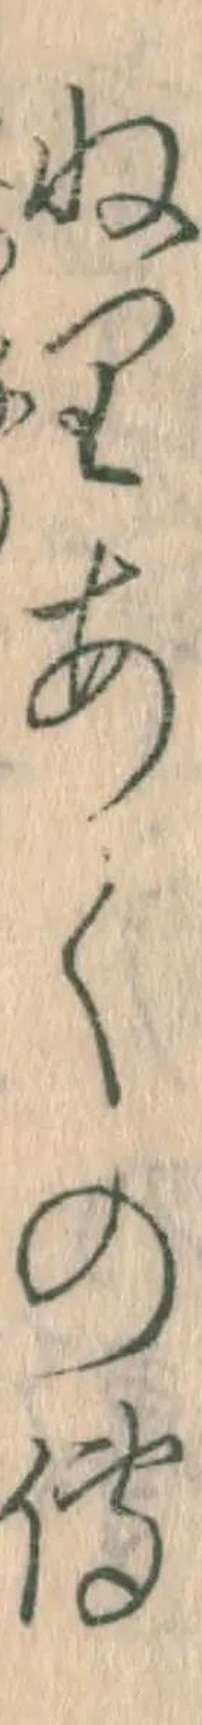ねりあくの傳
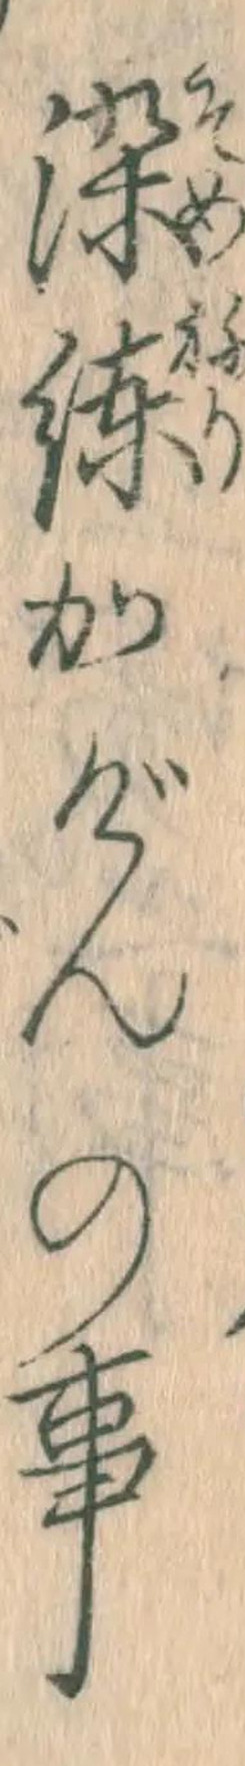染練加げんの事
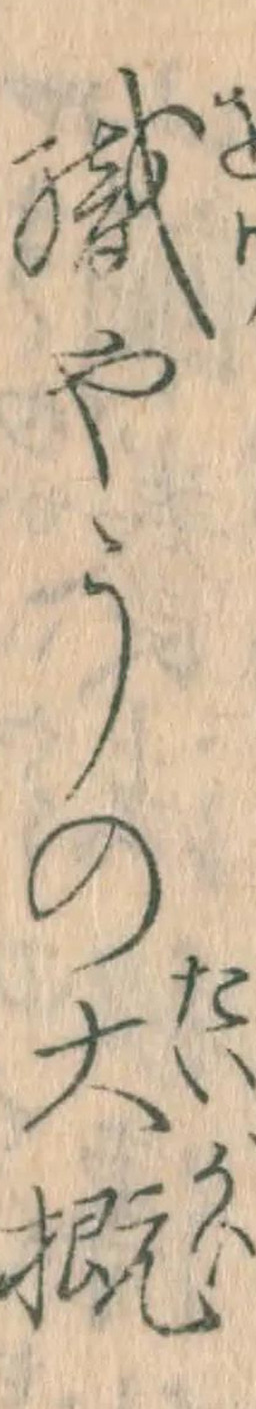織やうの大概
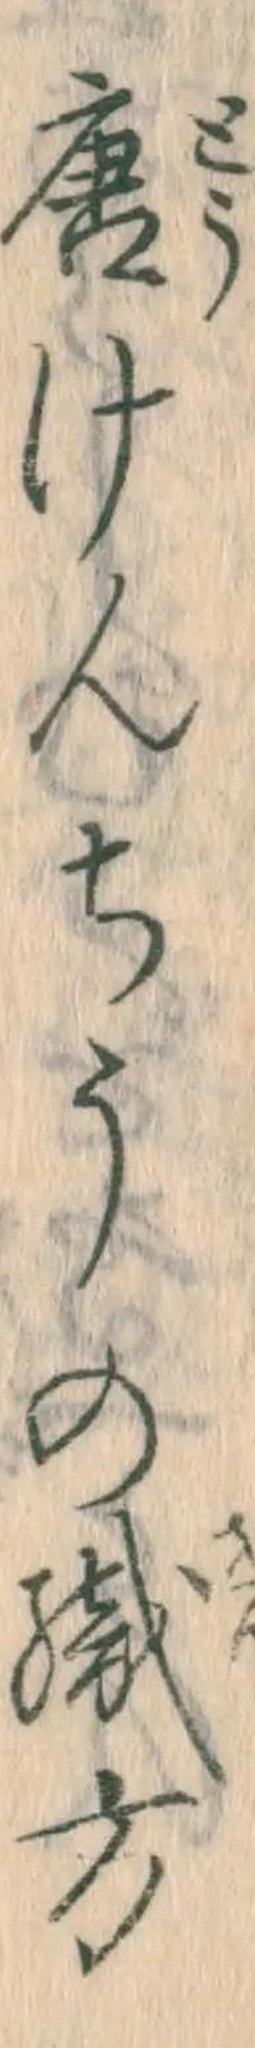唐けんちうの織方
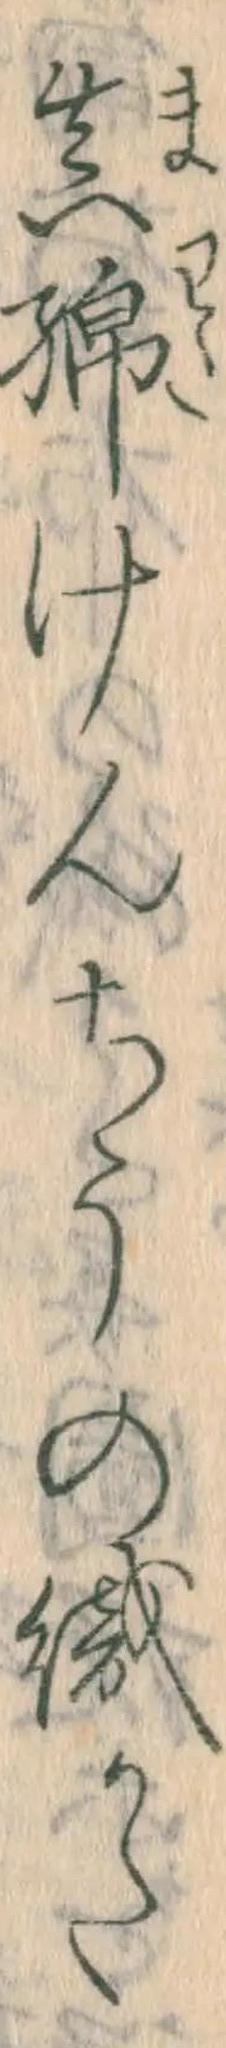真綿けんちうの織かた
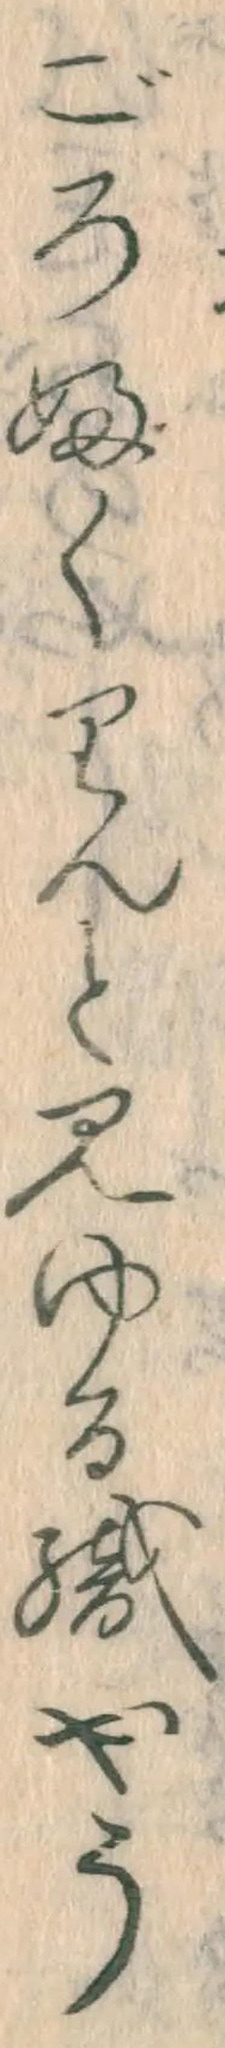ごろふくりんと見ゆる織やう
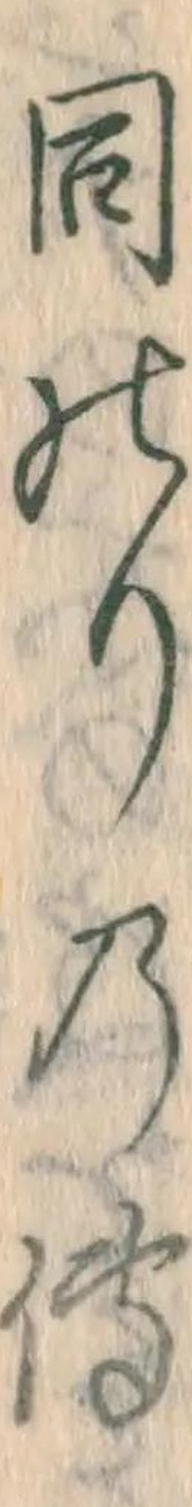同のりの傳
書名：山繭養法秘傳抄
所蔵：国立国会図書館 National Diet Library, JAPAN
